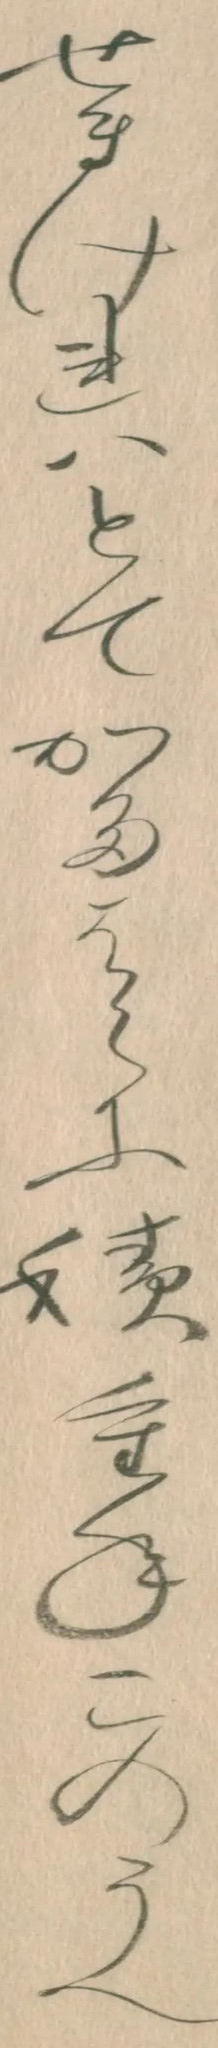せまけれはとてかたはらに積重ねこのうへ
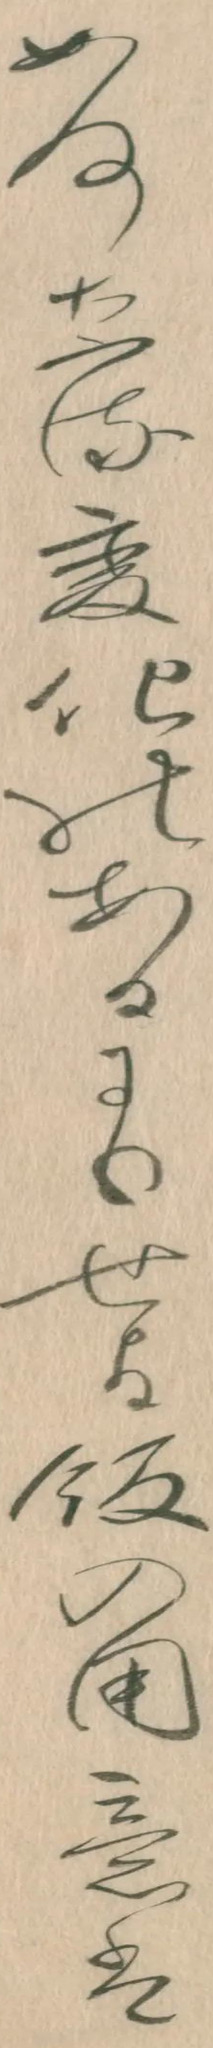如何なる変化のあるにもせよ飯の用意は
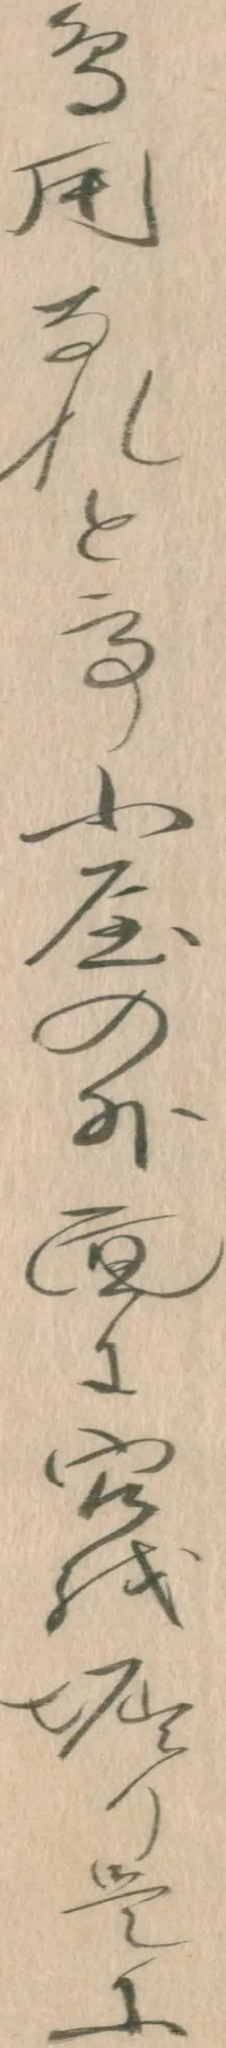鳥用なれとて小屋の外面に穴を掘り是に
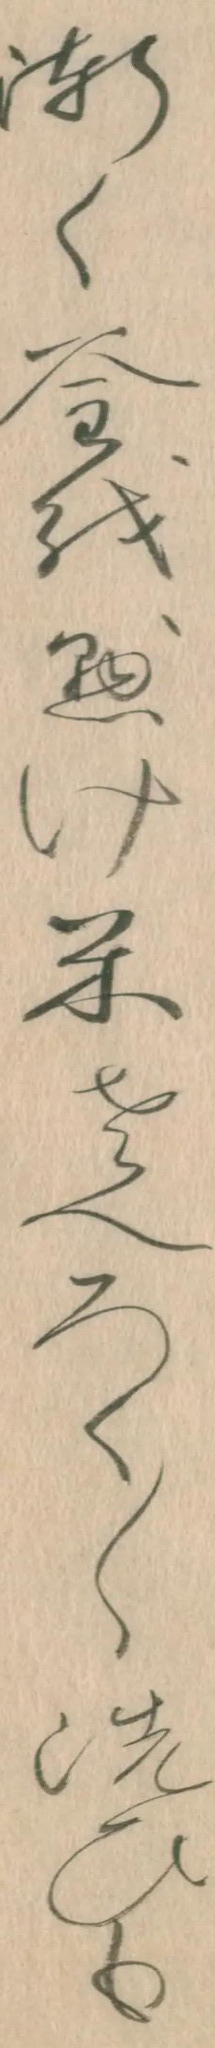漸く釜を懸け米さへろく〳〵洗ひも
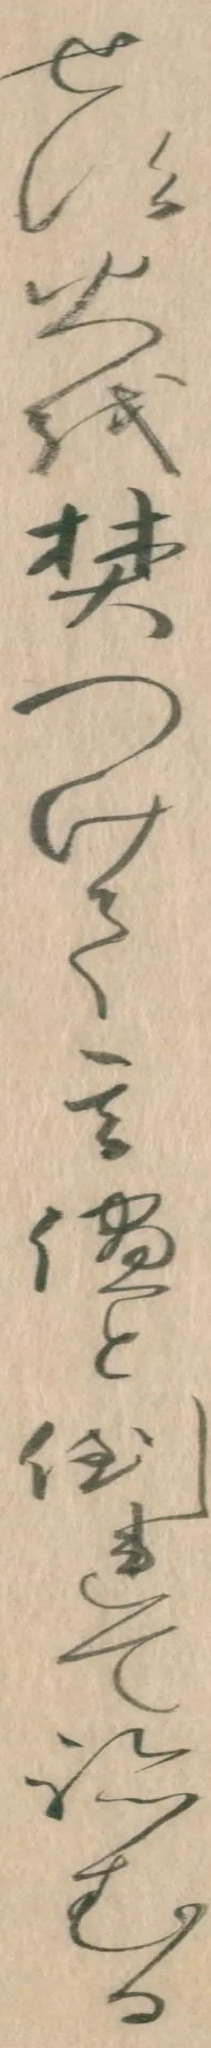せす火を焚つけて其儘と倒れてねむる
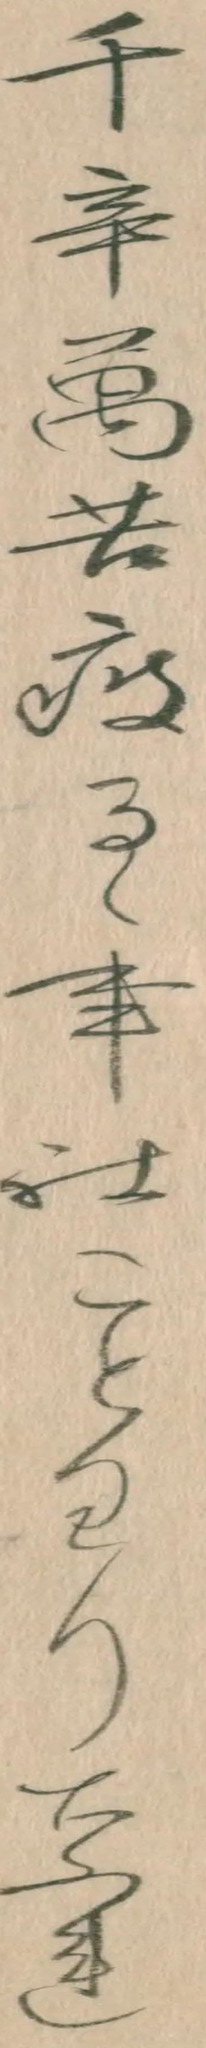千辛万苦疲るゝ事社ことわりなれ
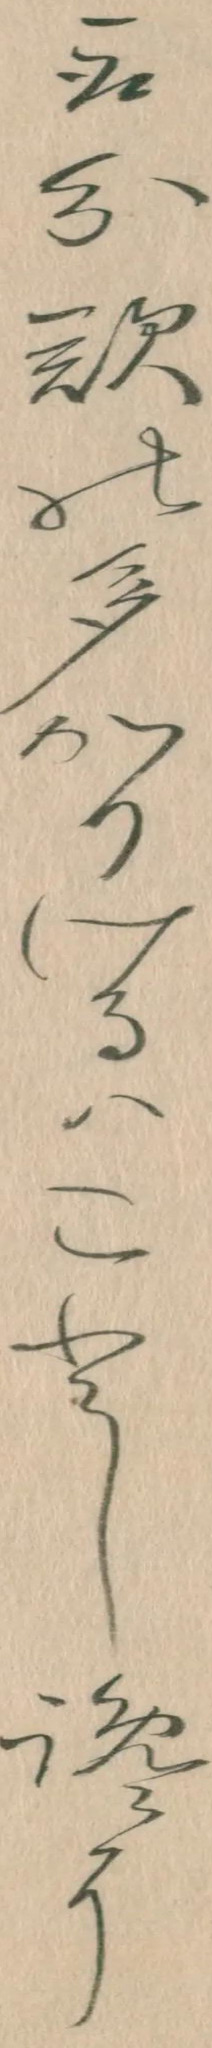取分歎の多かりけるはことし纔に
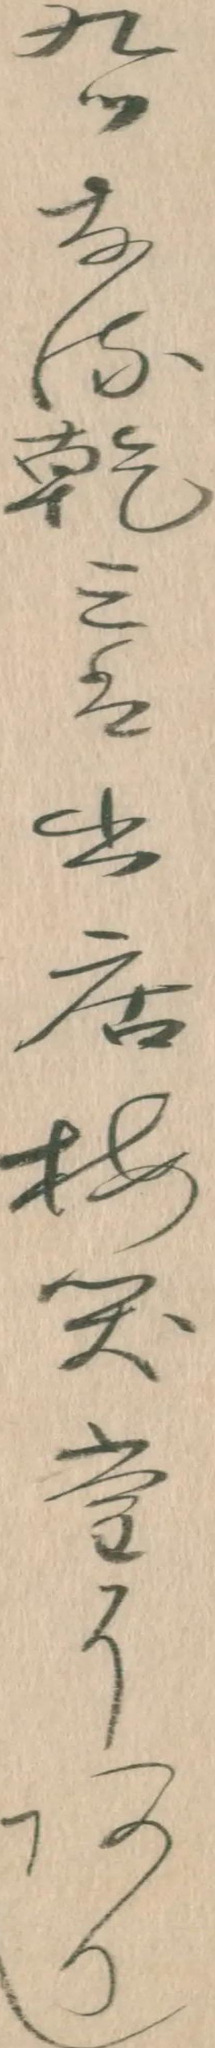九っなる乾三は出店梅笑堂にありし
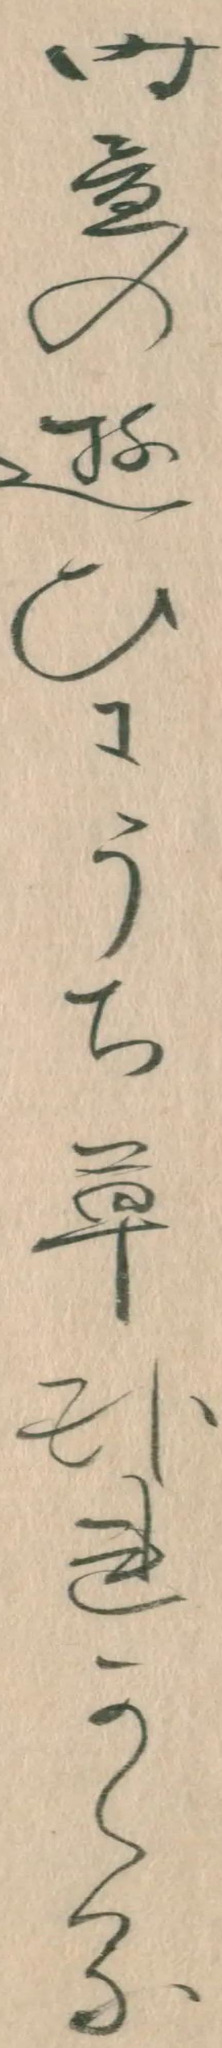時昼の遊ひにうち草臥れかへる
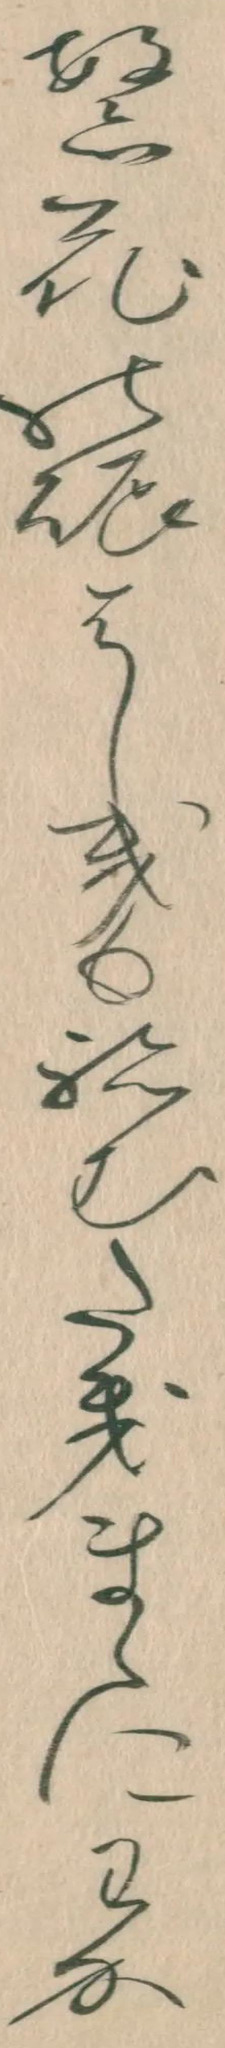繁花の賑はしきもねむたきまゝにわか
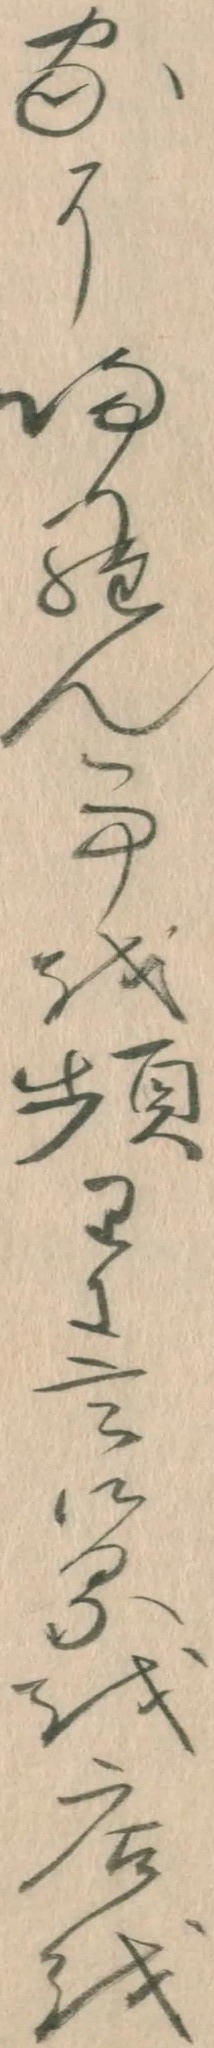家に帰らん事を頻りに言けるを店を
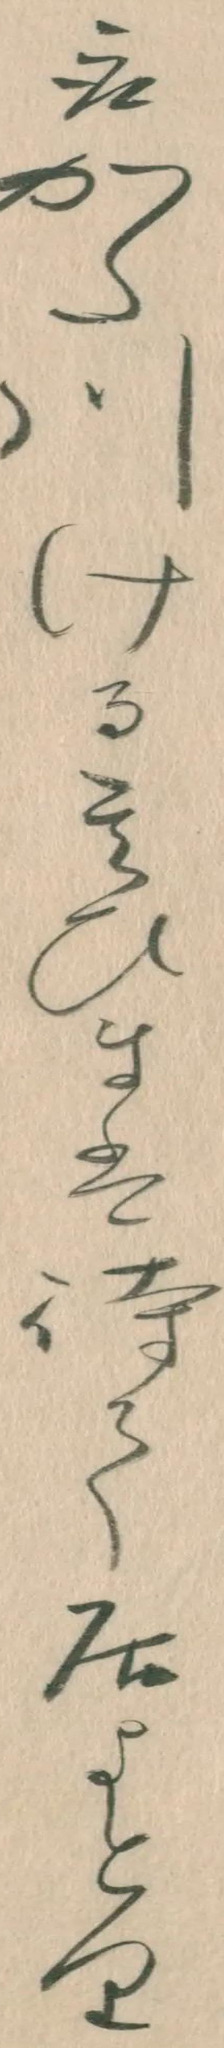取かたつける其ひまは待て居よと里
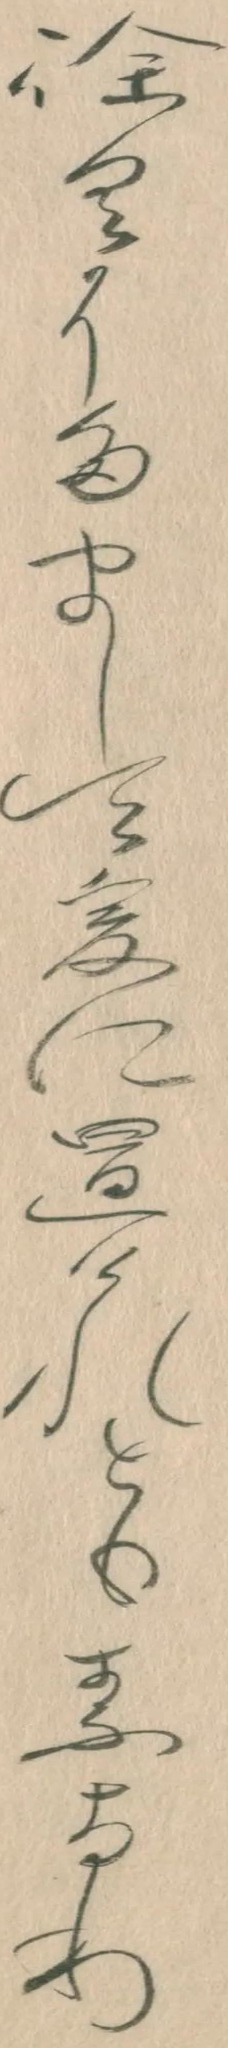徐くにたまして爰に置けれとも素より
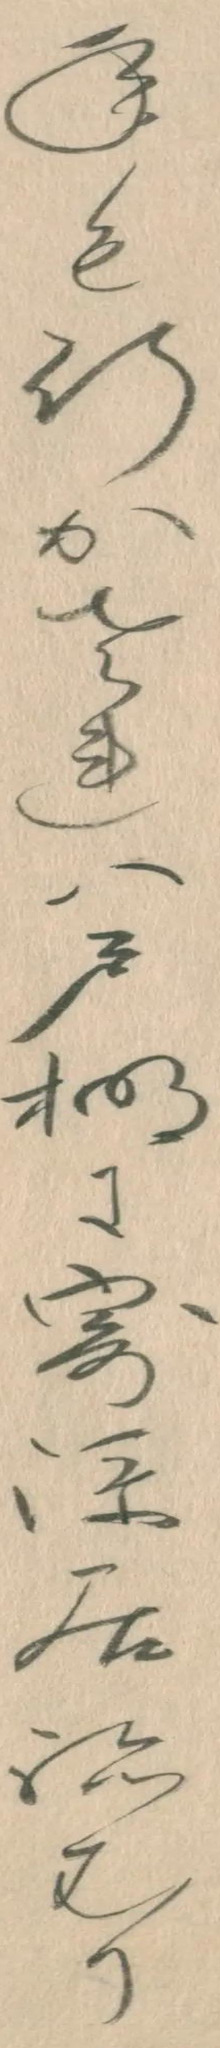年も行かされは戸棚に寄添居ねむり
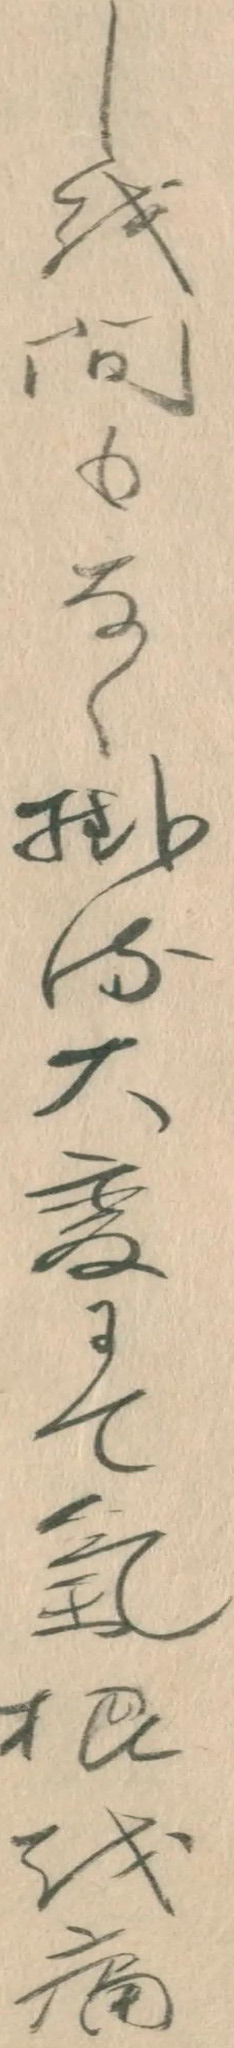しを間もなく掛る大変にて気根を痛

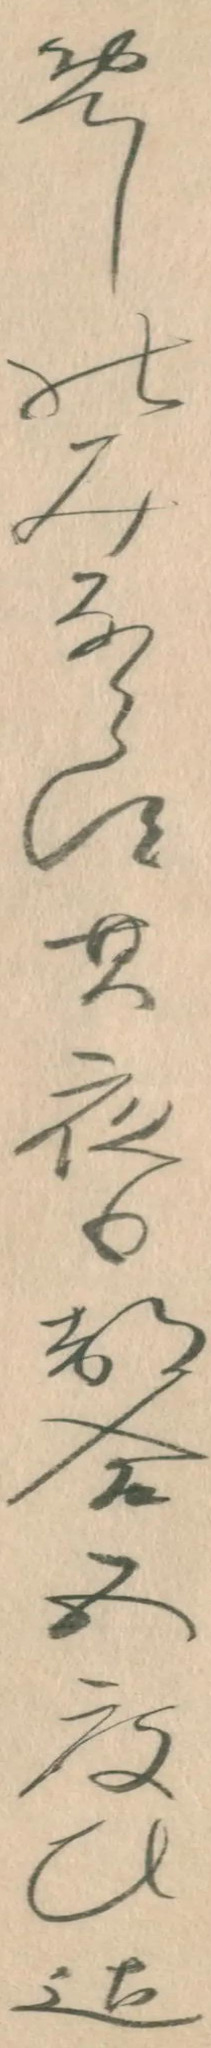めしのみならす其夜も都合五度ひ迄
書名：俗語之種. [5]
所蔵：国立国会図書館 National Diet Library, JAPAN
